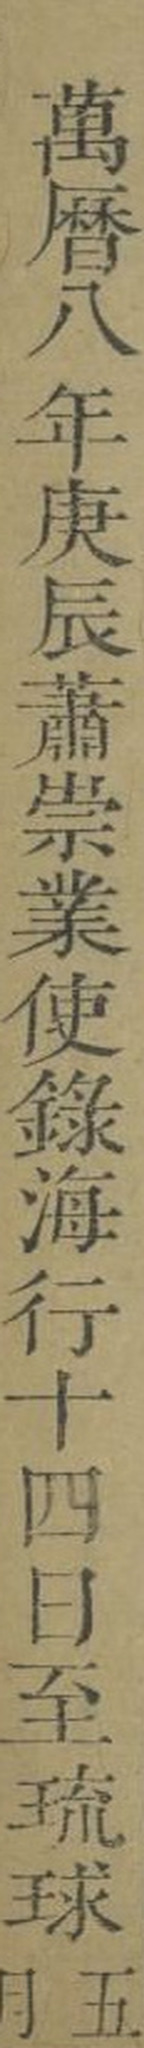萬曆八年庚辰蕭崇業使錄海行十四日至琉球五月

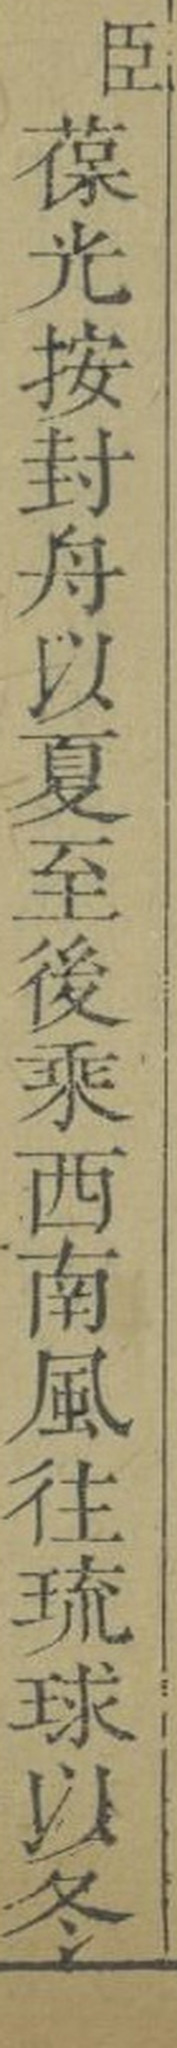臣葆光按封舟以夏至後乘西南風往琉球以冬
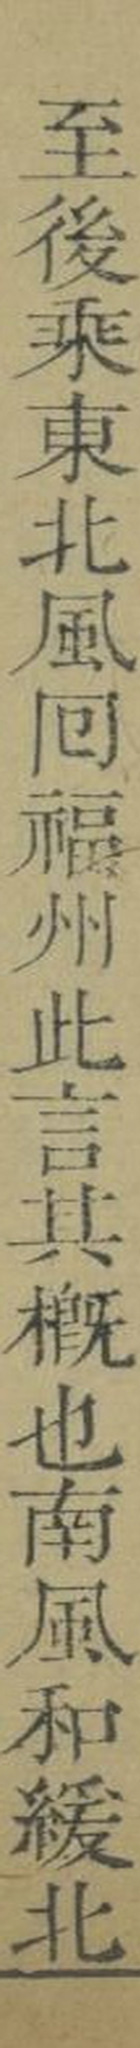至後乘東北風囘福州此言其槪也南風和緩北
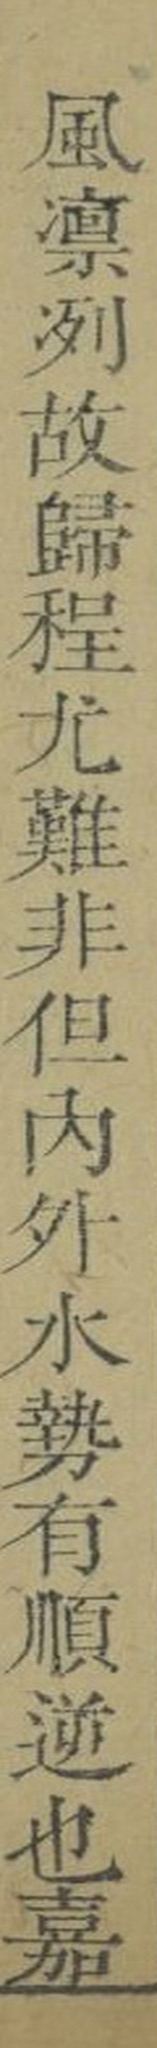風凛冽故歸程尤難非但内外水勢有順逆也嘉
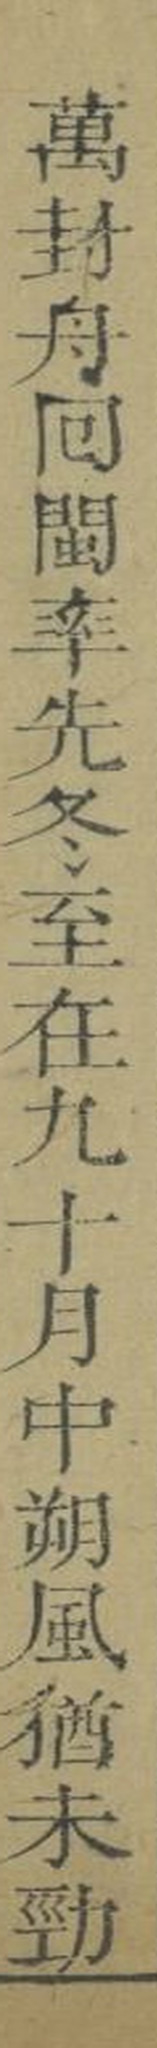萬封舟囘閩率先冬至在九十月中朔風猶未勁
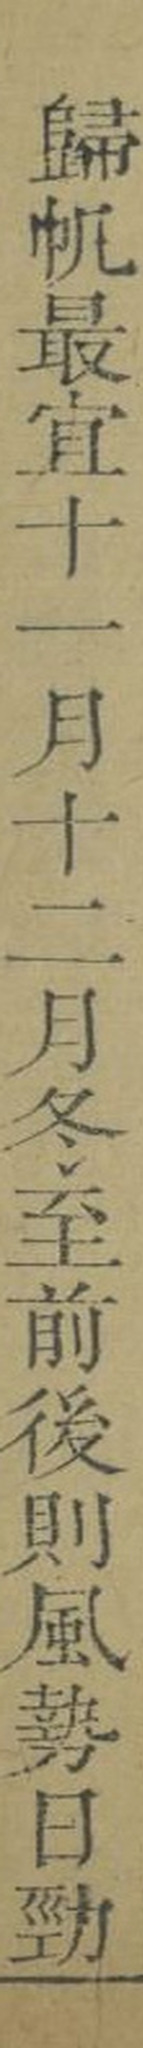歸帆最宜十一月十二月冬至前後則風勢日勁
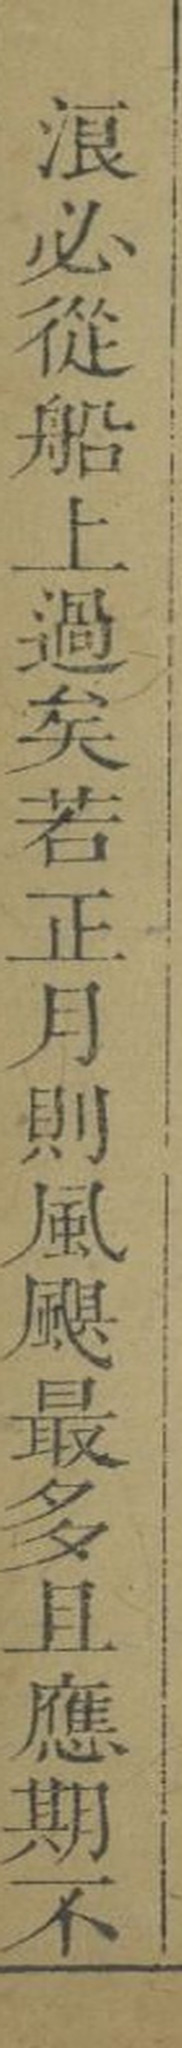浪必從船上過矣若正月則風颶最多且應期不

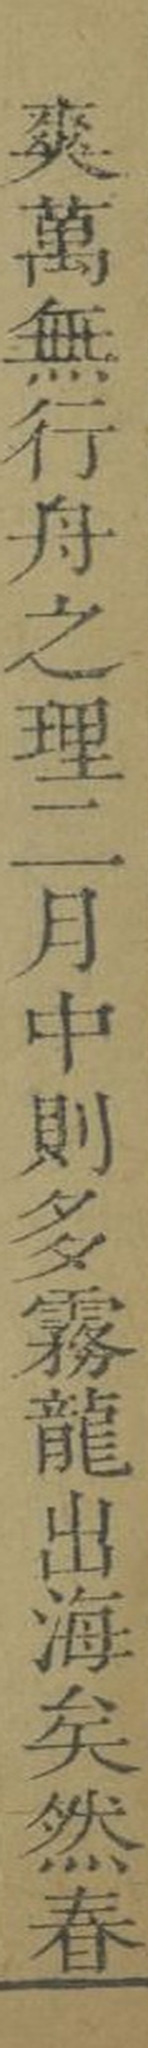爽萬無行舟之理二月中則多霧龍出海矣然春
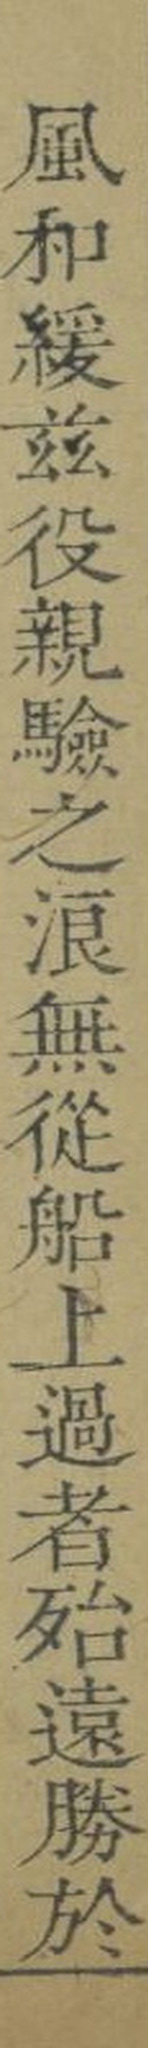風和緩茲役親驗之浪無從船上過者殆遠勝於
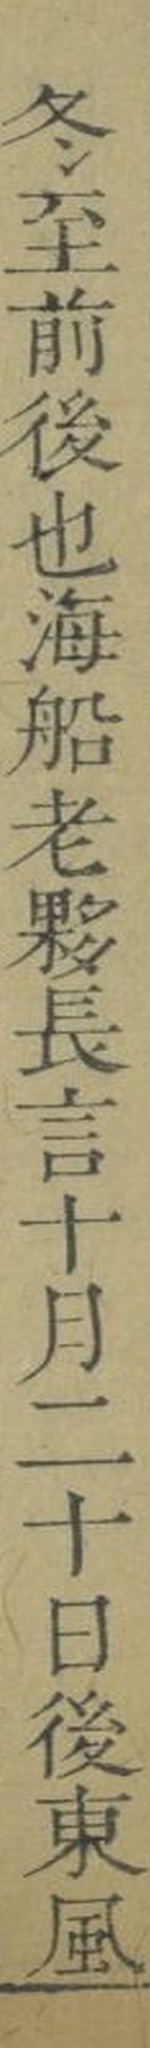冬至前後也海船老夥長言十月二十日後東風
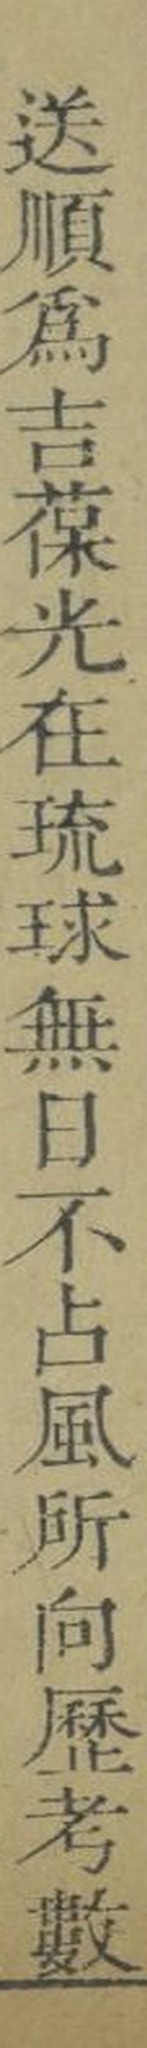送順爲吉葆光在琉球無日不占風所向歷考數
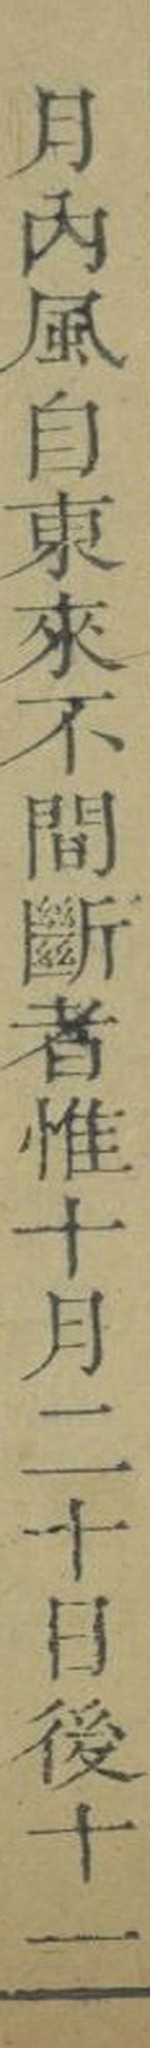月内風自東來不間斷者惟十月二十日後十一
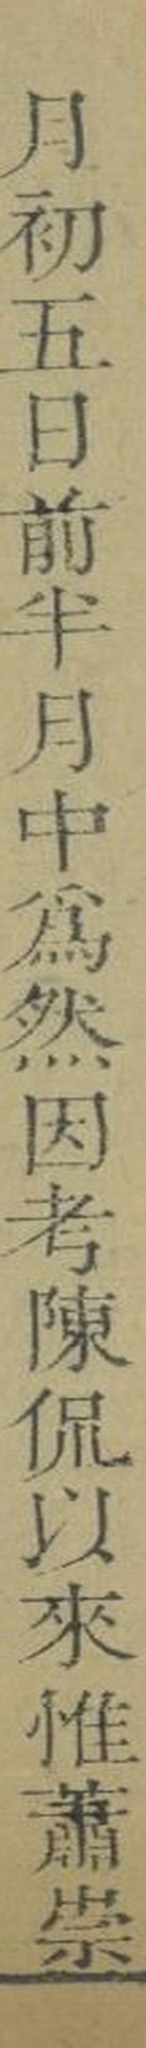月初五日前半月中爲然因考陳侃以來惟蕭崇
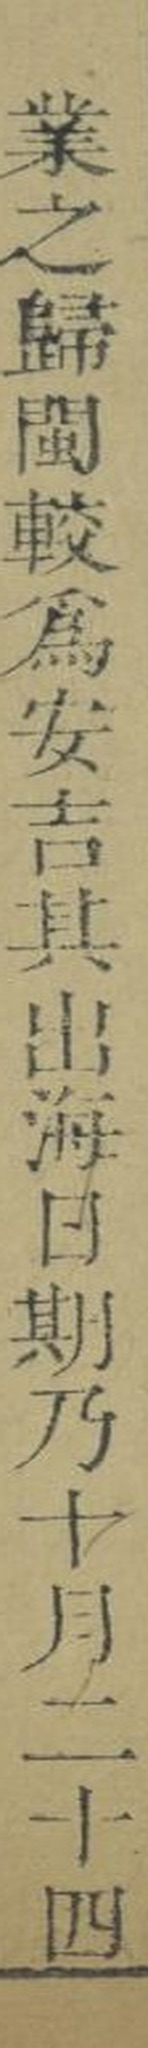業之歸閩較爲安吉其出海日期乃十月二十四
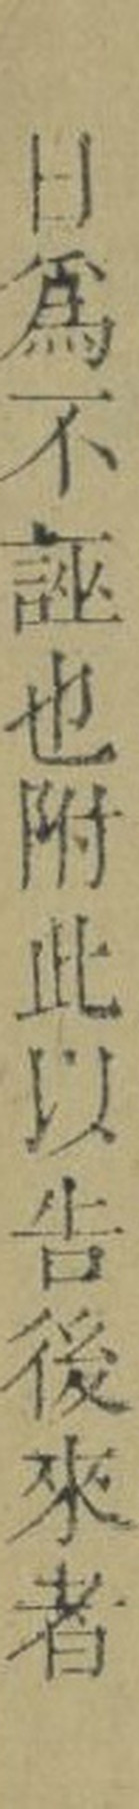日爲不誣也附此以告後來者
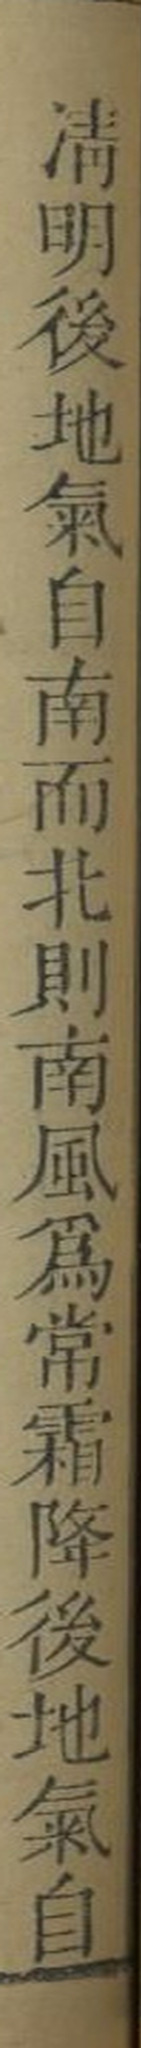淸明後地氣自南而北則南風爲常霜降後地氣自
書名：中山伝信録 巻一
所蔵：University of the Ryukyus Library
